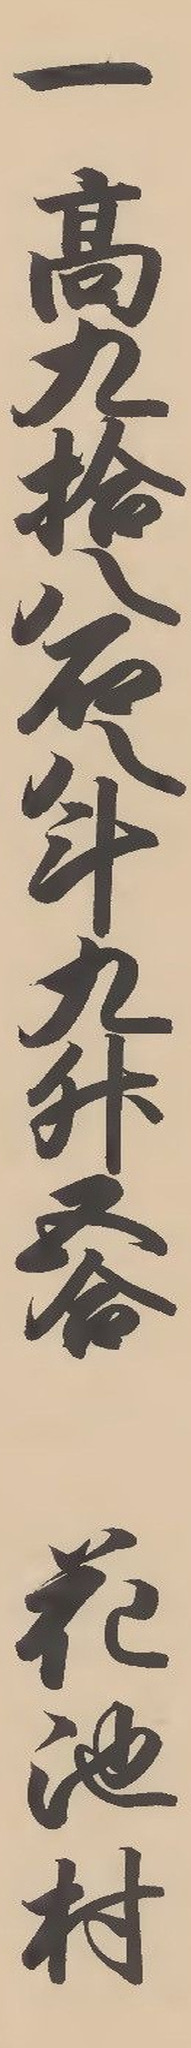一高九拾八石八斗九升五合花池村
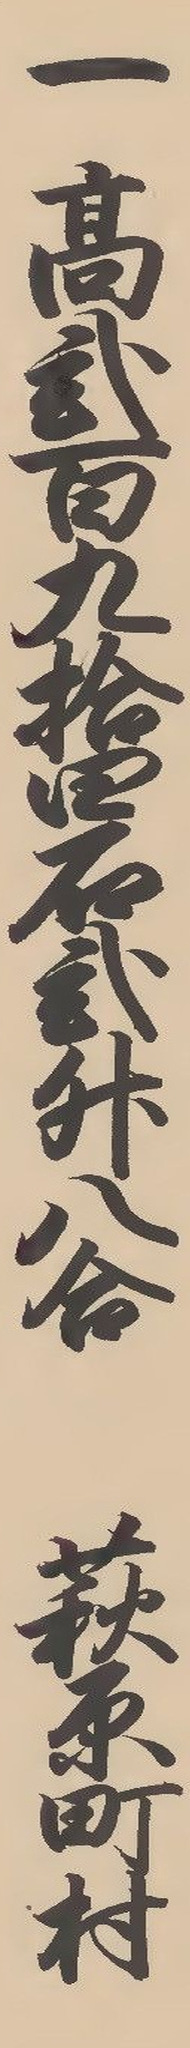一高弐百九拾四石弐升八合萩原町村
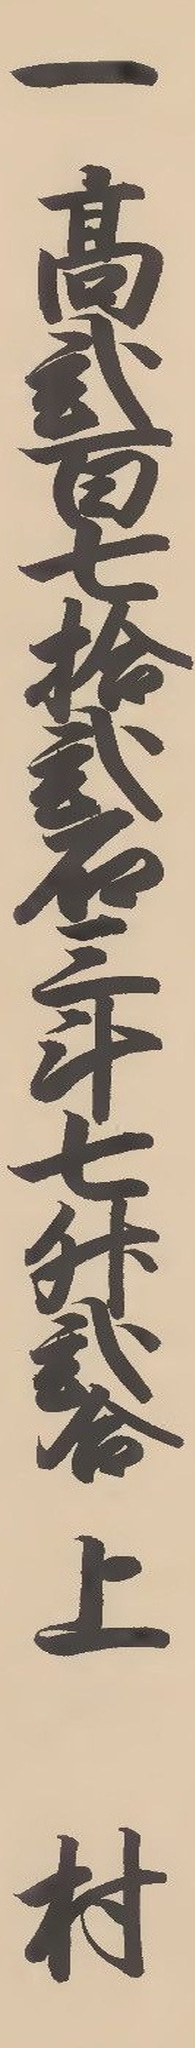一高弐百七拾弐石三斗七升弐合上村
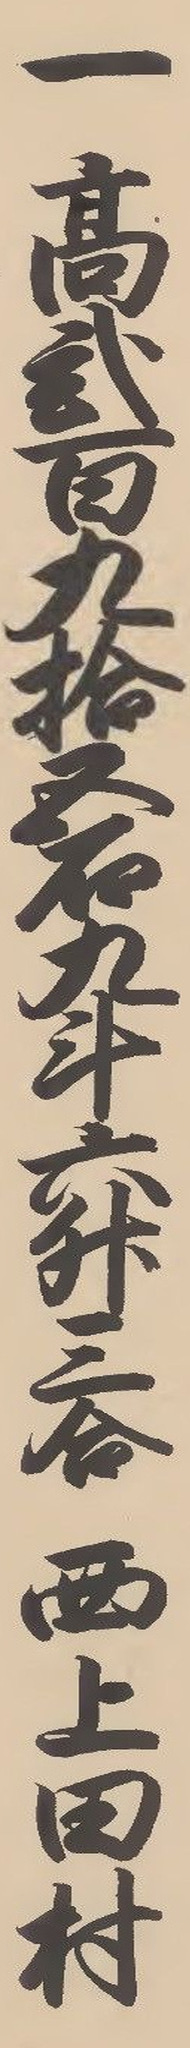一高弐百九拾五石九斗六升三合西上田村
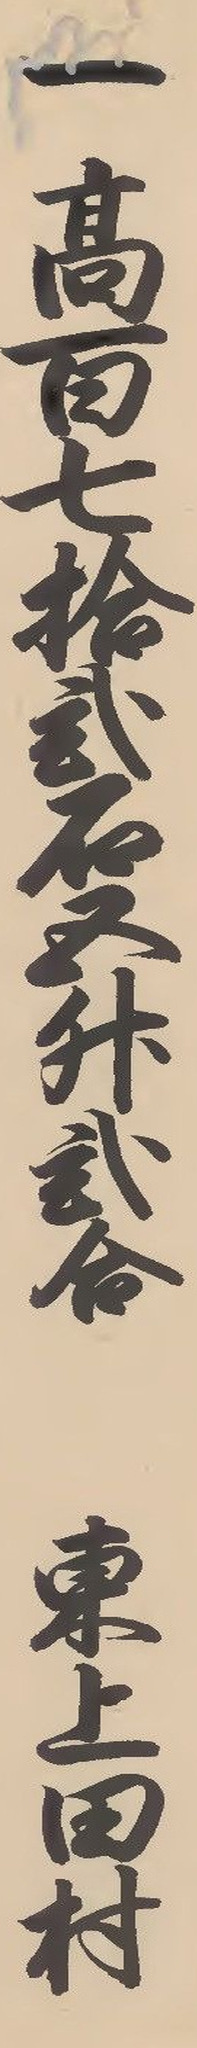一高百七拾弐石五升弐合東上田村
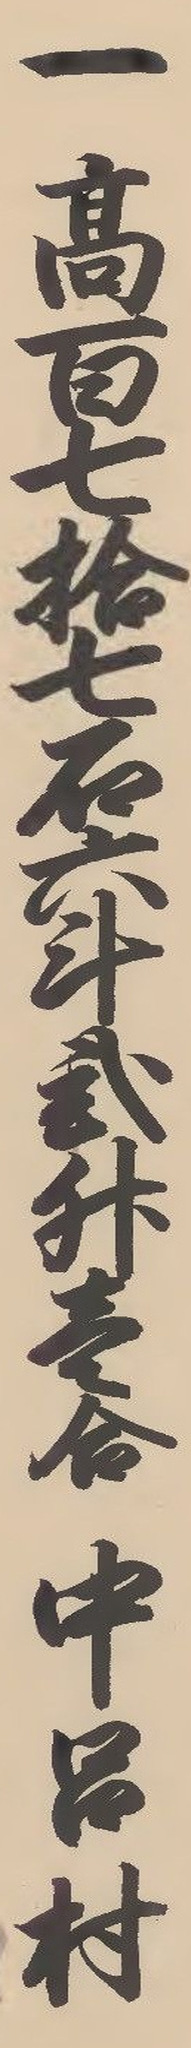一高百七拾七石六斗弐升壱合中呂村

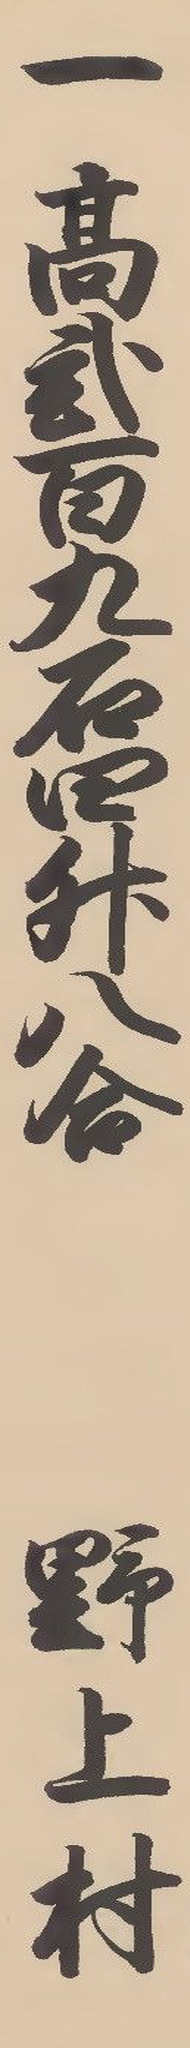一高弐百九石四升八合野上村
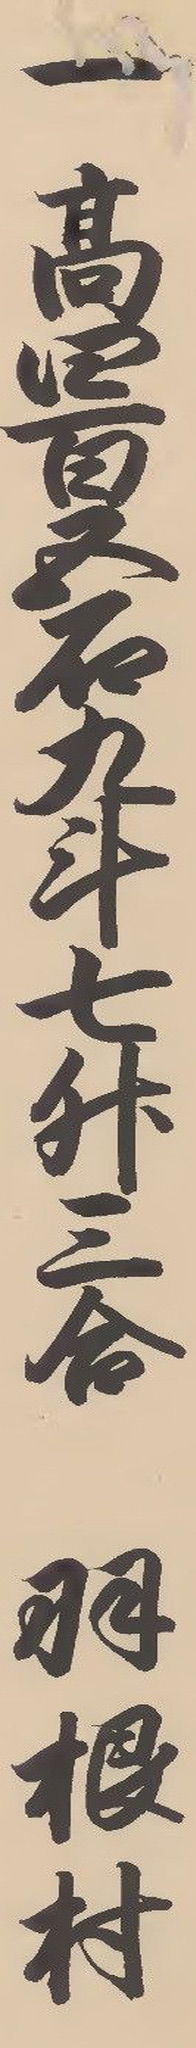一高四百五石九斗七升三合羽根村
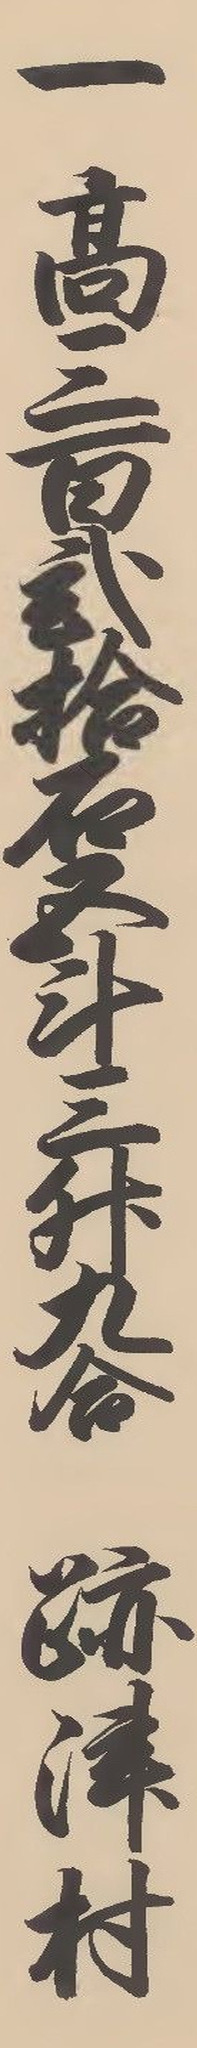一高三百弐拾石五斗三升九合跡津村
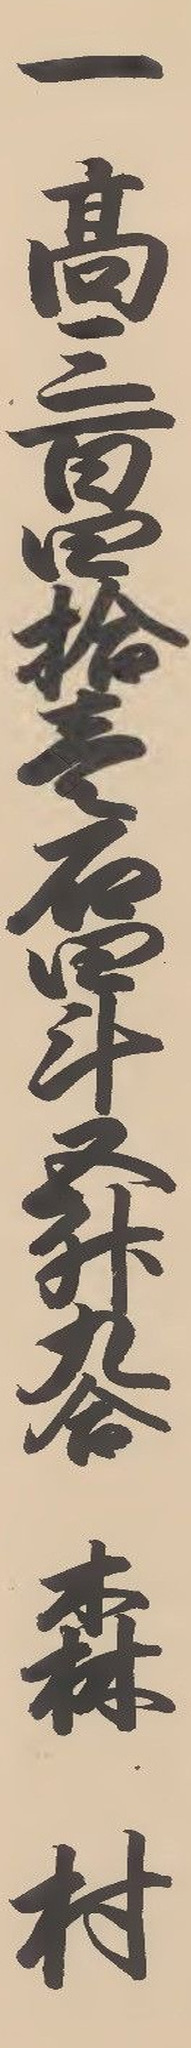一高三百四拾壱石四斗五升九合森村
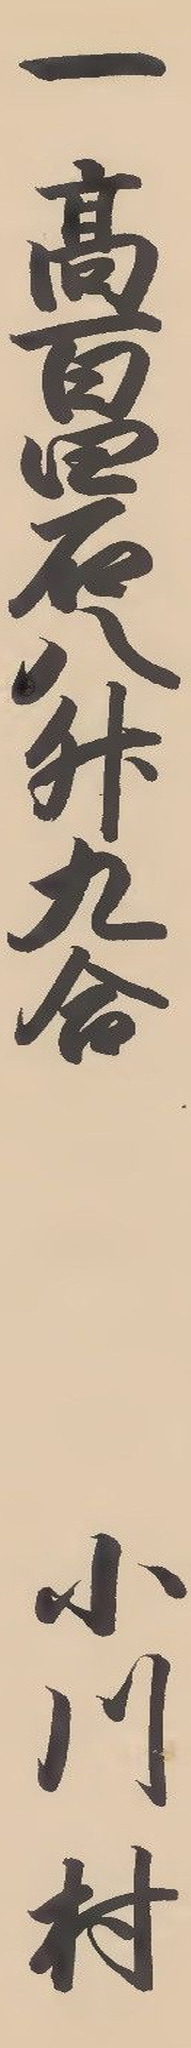一高百四石八升九合小川村
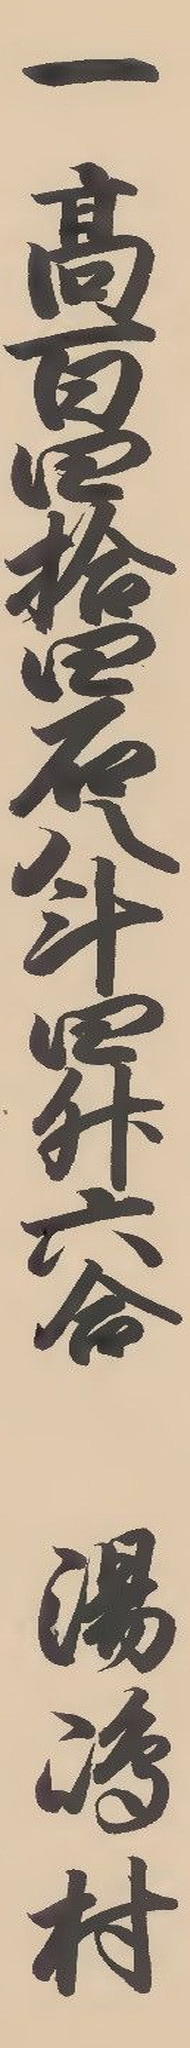一高百四拾四石八斗四升六合湯島村
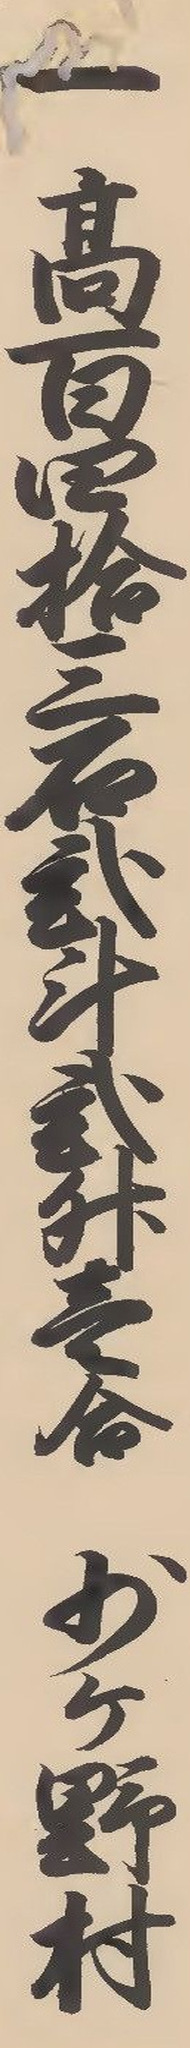一高百四拾三石弐斗弐升壱合少ヶ野村
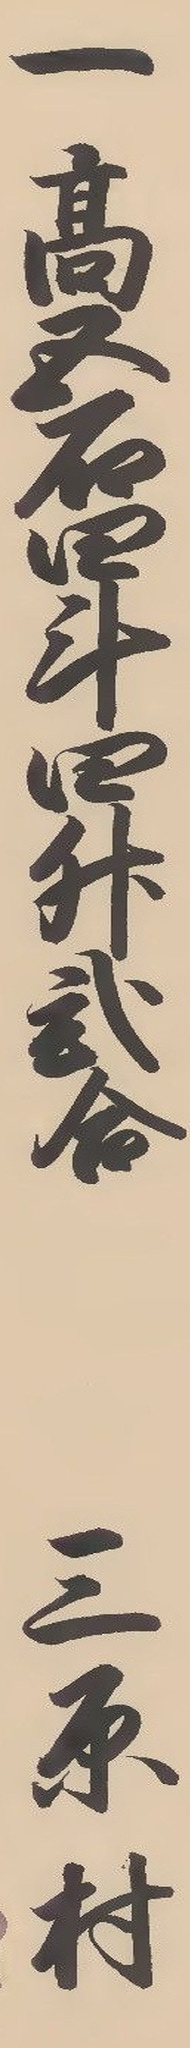一高五石四斗四升弐合三原村

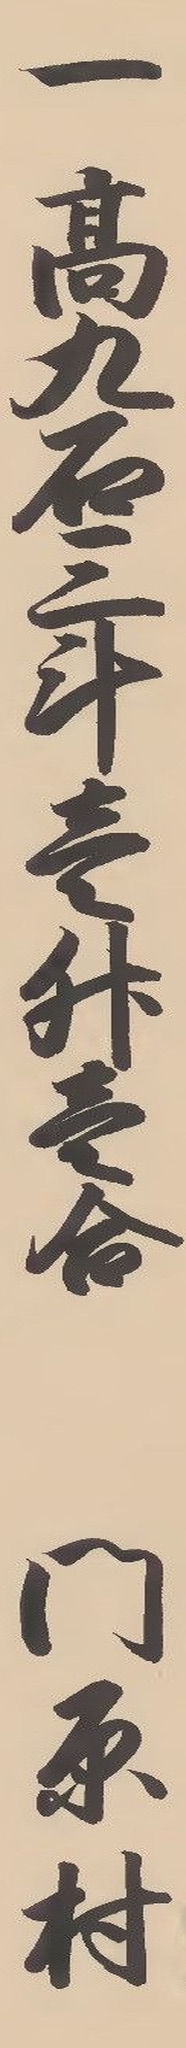一高九石三斗壱升壱合門原村
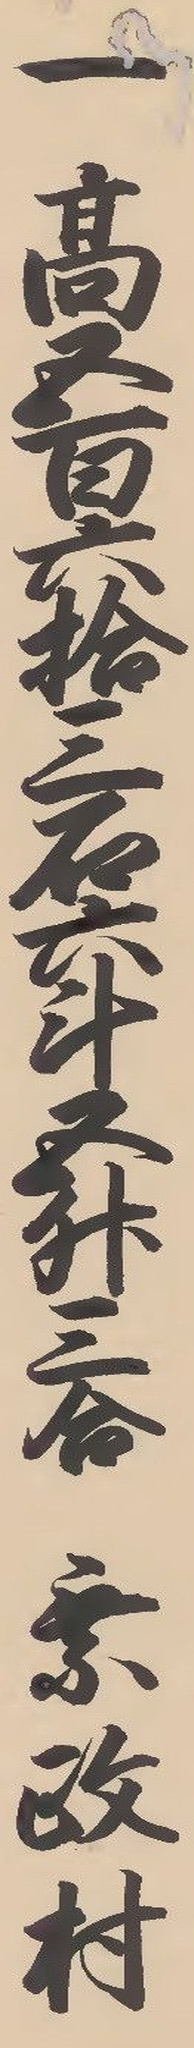一高五百六拾三石六斗五升三合乗政村
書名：飛騨国郷帳
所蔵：国立公文書館 National Archives of Japan
